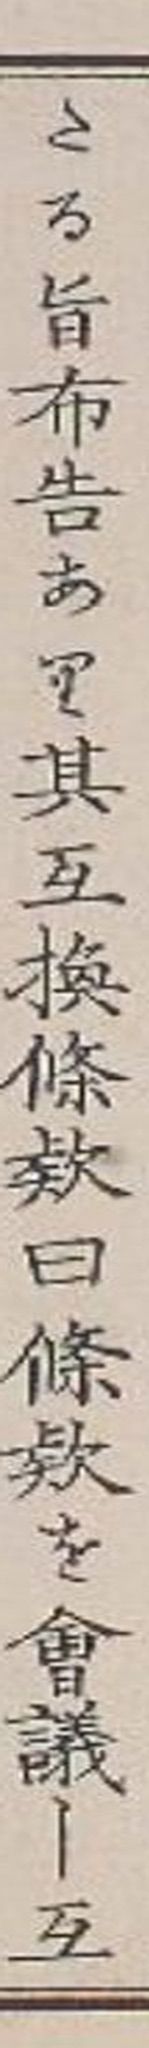たる旨布告あり其互換条款曰条款を会議し互
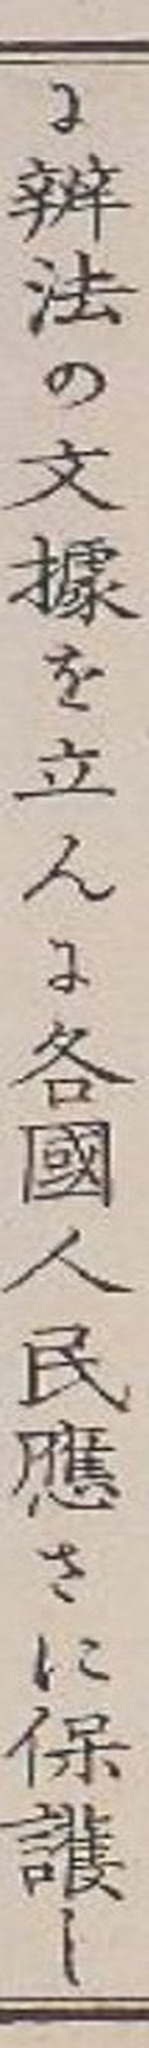に弁法の文拠を立んに各国人民応さに保護し
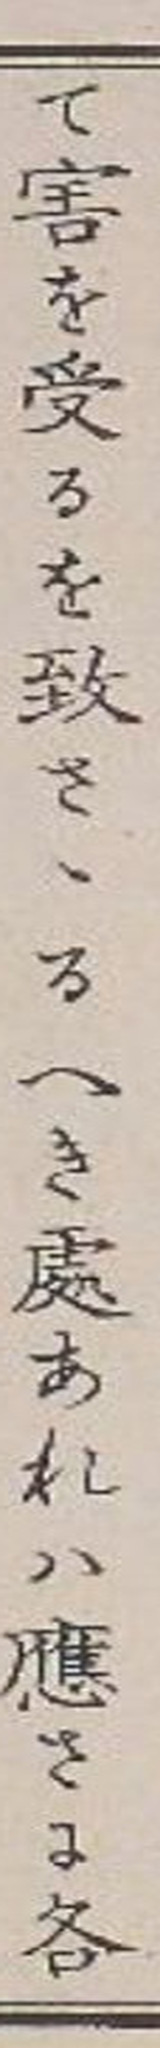て害を受るを致さゝるへき所あれは応さに各
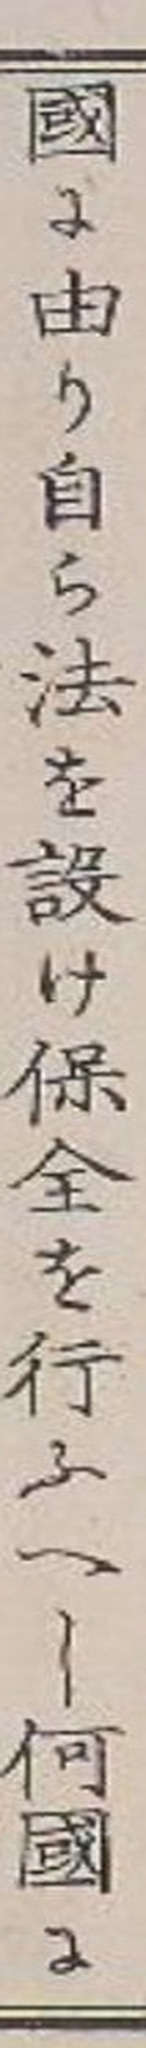国に由り自ら法を設け保全を行ふへし何国に
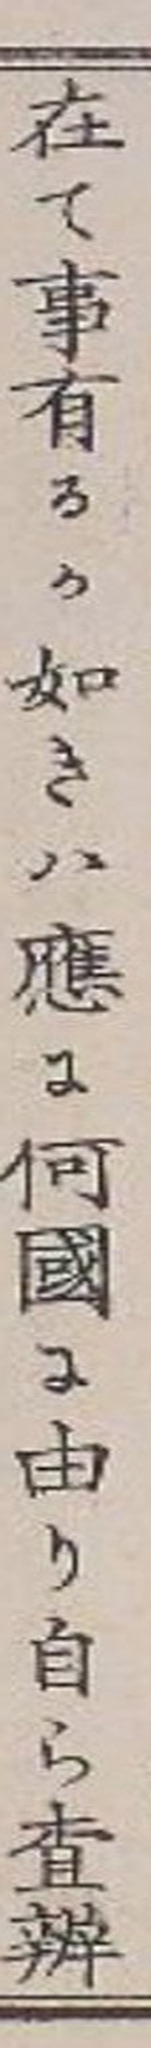在て事有るか如きは応に何国に由り自ら査弁
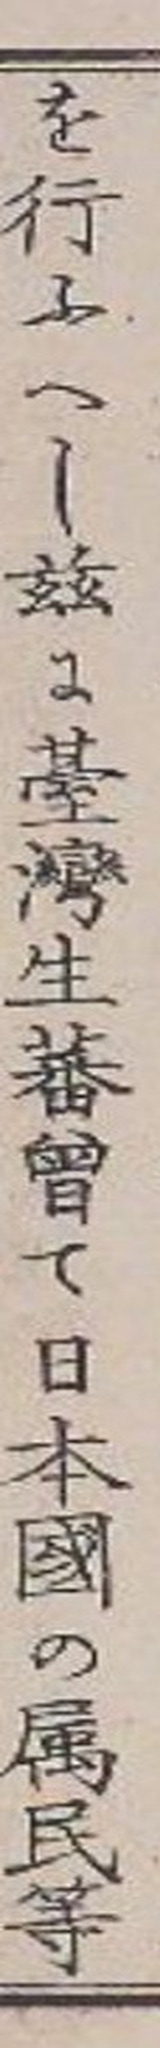を行ふへし茲に台湾生蕃曽て日本国の属民等

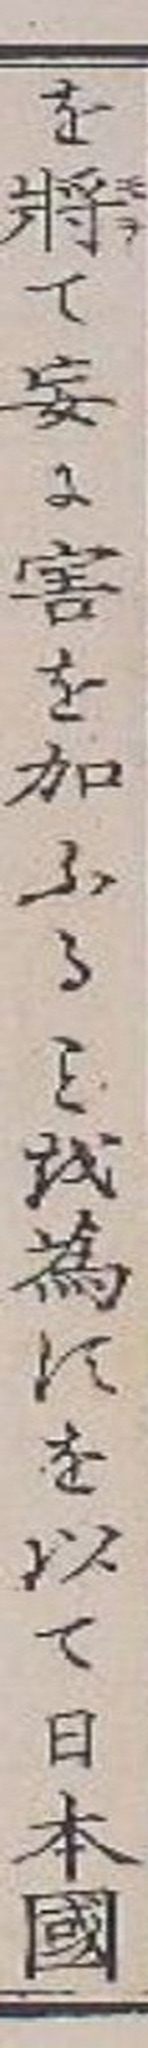を将て安に害を加ふることを為すを以て日本国
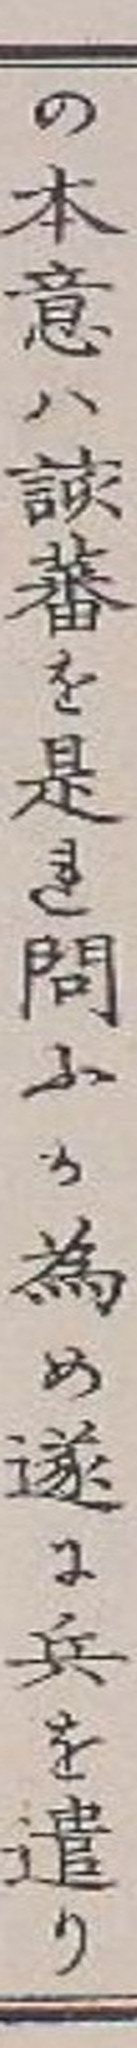の本意は該蕃を是れ問ふか為め遂に兵を遣り
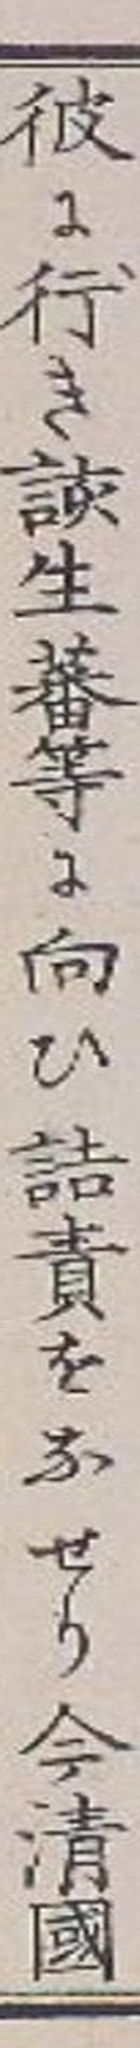彼に行き該生蕃等に向ひ詰責をなせり今清国
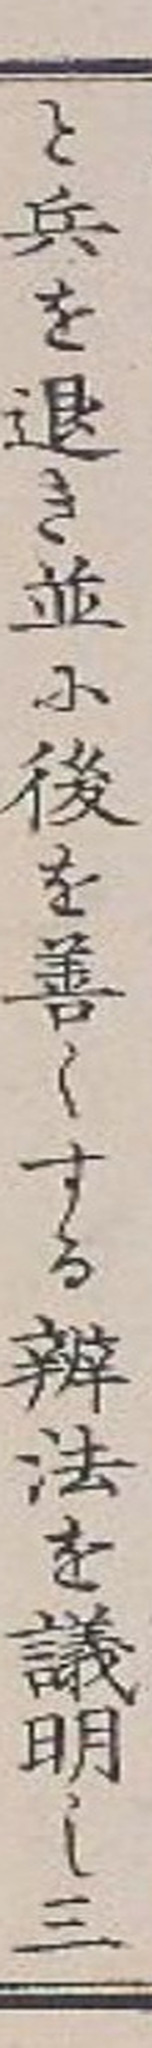と兵を退き並に後を善くする弁法を議明し三
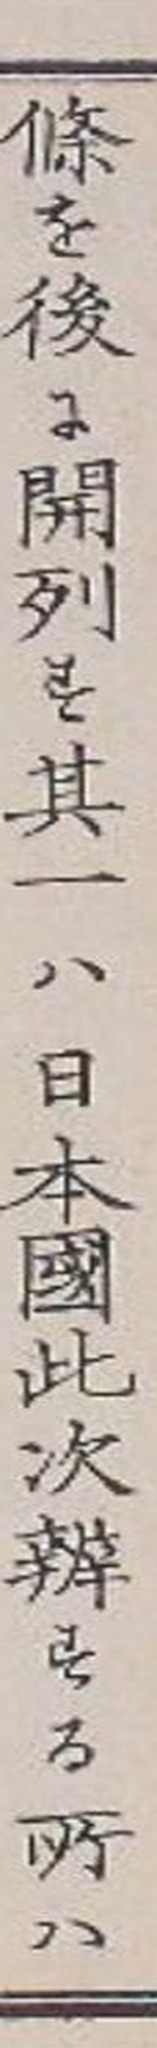条を後に開列す其一は日本国此次弁する所は
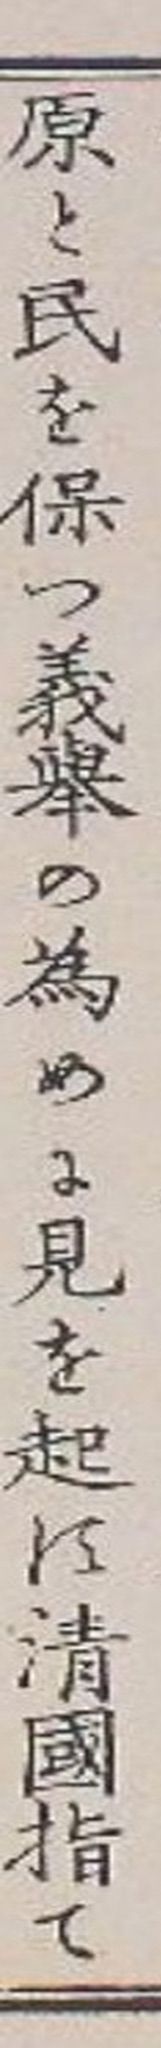原と民を保つ義挙の為めに見を起す清国指て
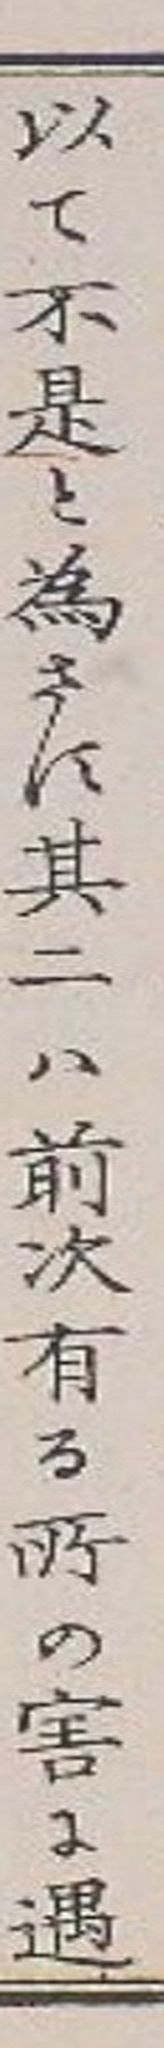以て不是と為さす其二は前次有る所の害に遇
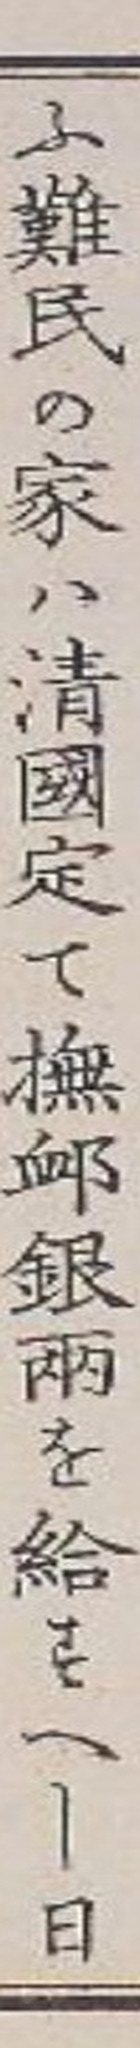ふ難民の家は清国定て撫卹銀両を給すへし日
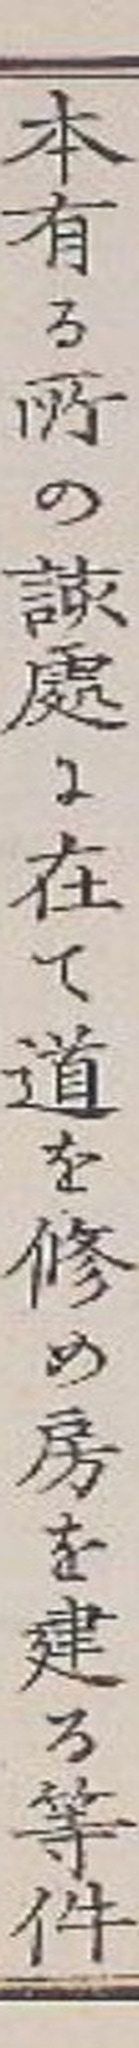本有る所の該処に在て道を修め房を建る等件
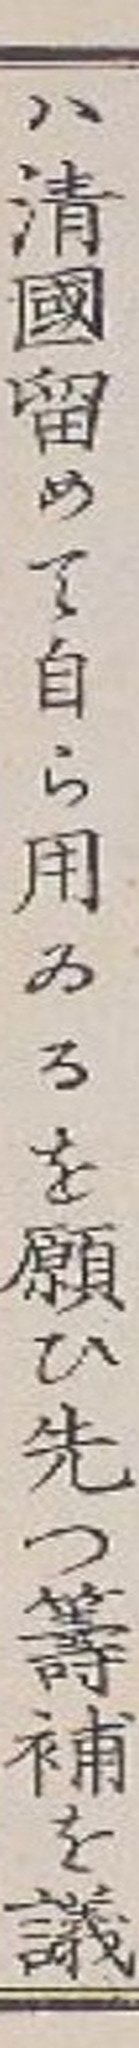は清国留めて自ら用ゐるを願ひ先つ籌補を議
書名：南島紀事 下
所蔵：University of the Ryukyus Library
